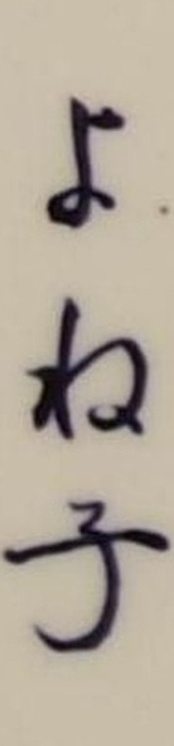よね子
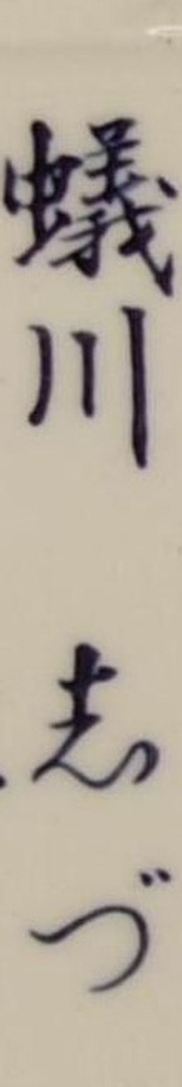蟻川しづ
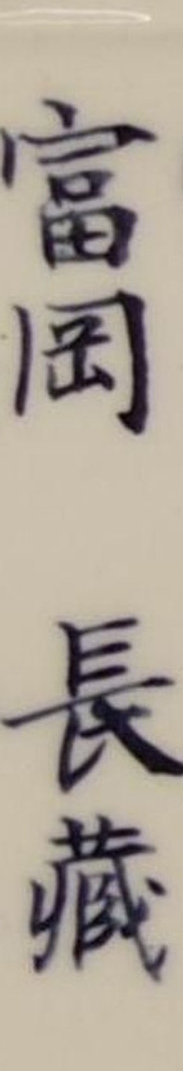富岡長蔵
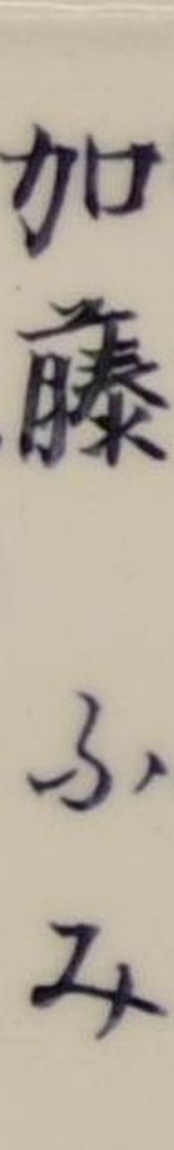加藤ふみ
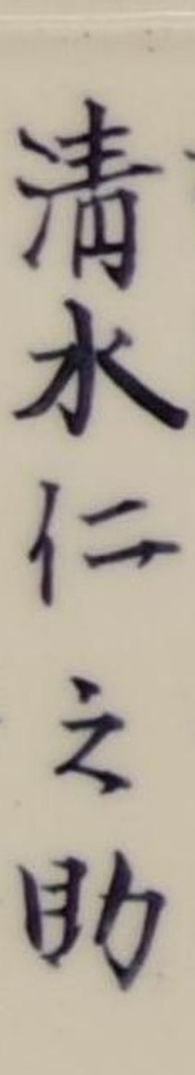清水仁之助
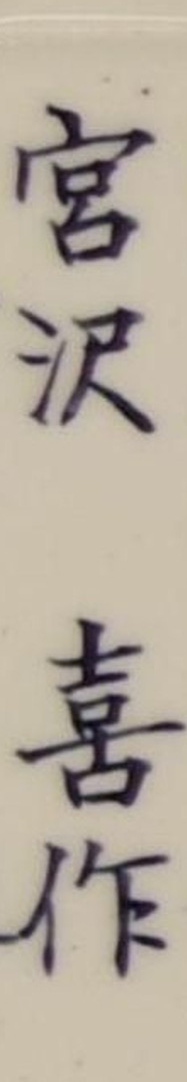宮沢喜作
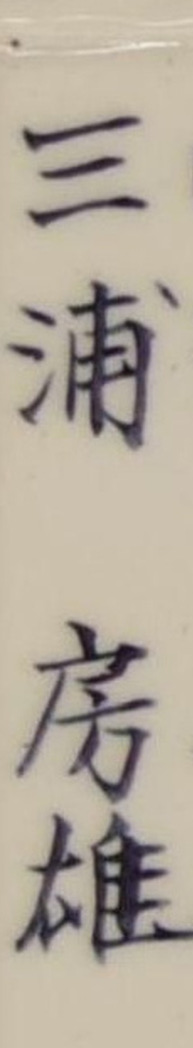三浦房雄

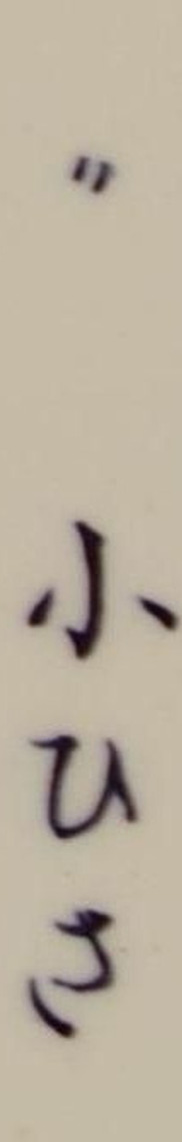小ひさ
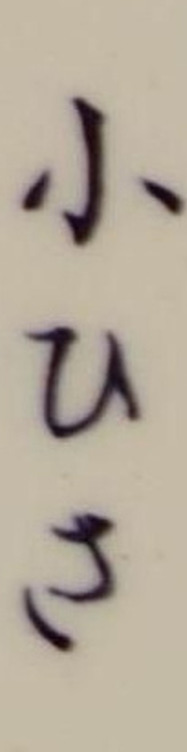小ひさ
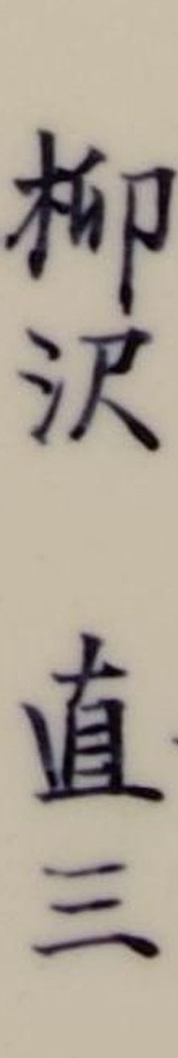柳沢直三
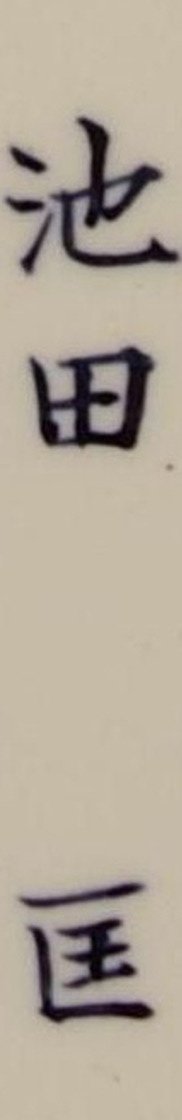池田匡
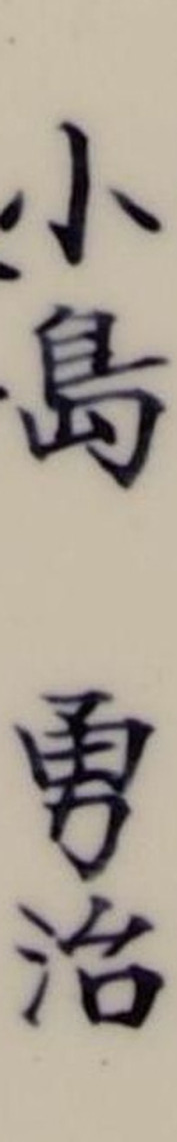小島勇治
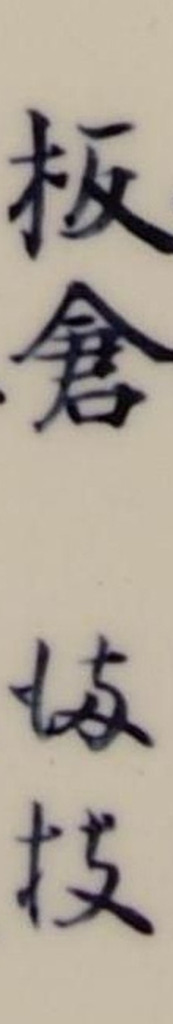板倉ま枝
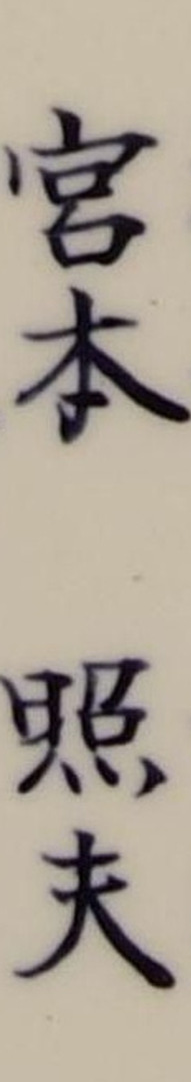宮本照夫
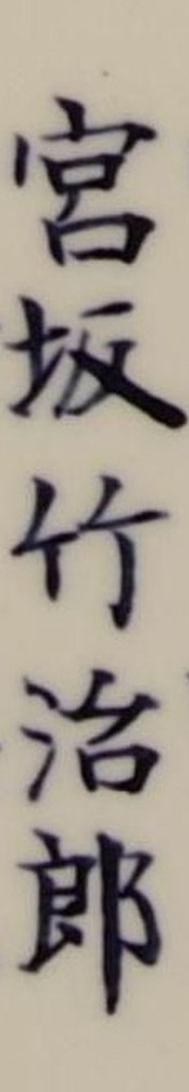宮坂竹治郎
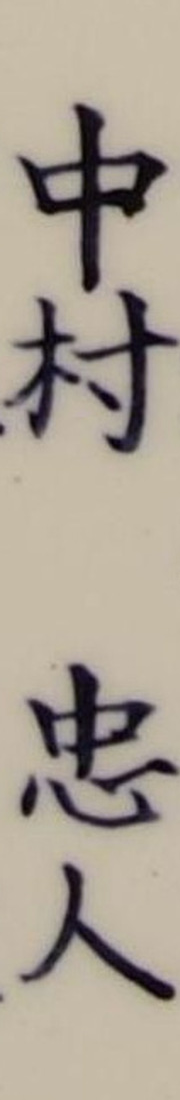中村忠人
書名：E~L
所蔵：高野山金剛峯寺
